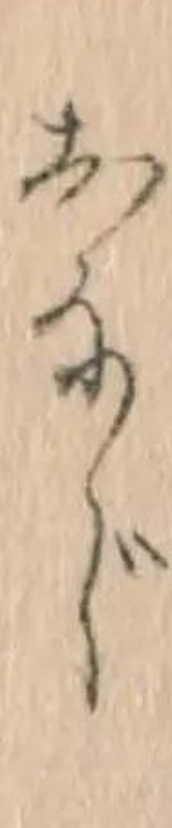おなじ
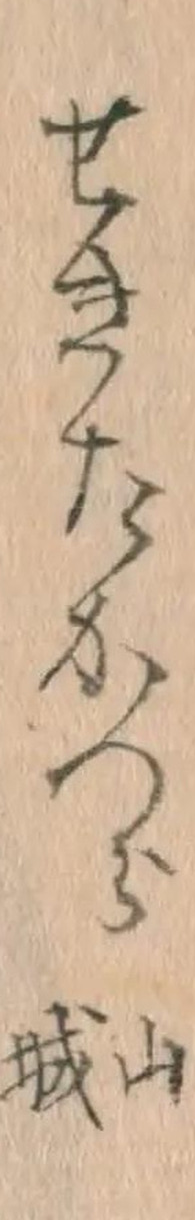せきたかづら
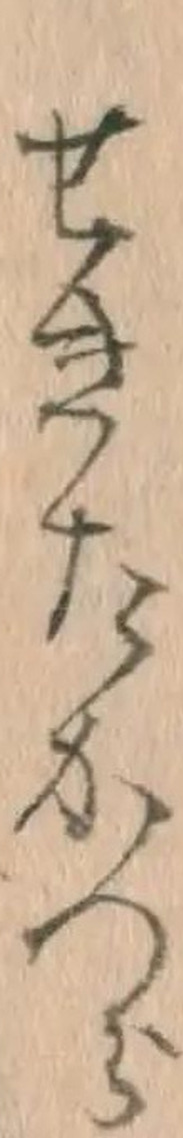せきたかづら
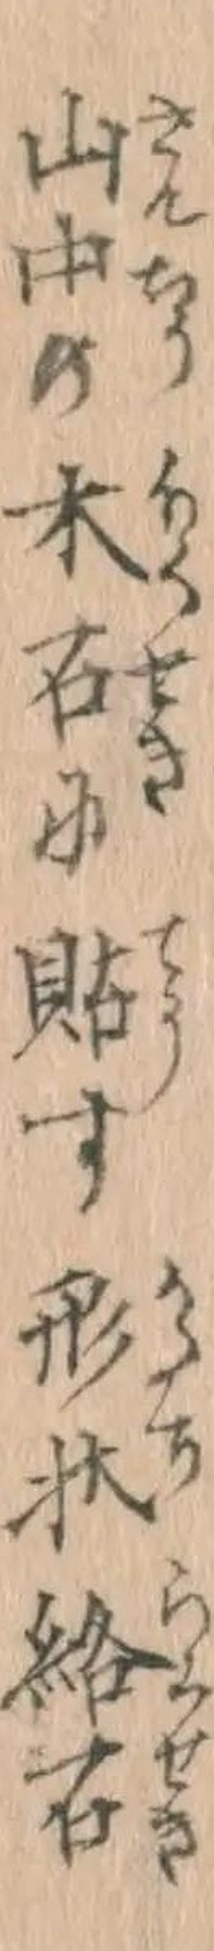山中の木石に貼す形状絡石
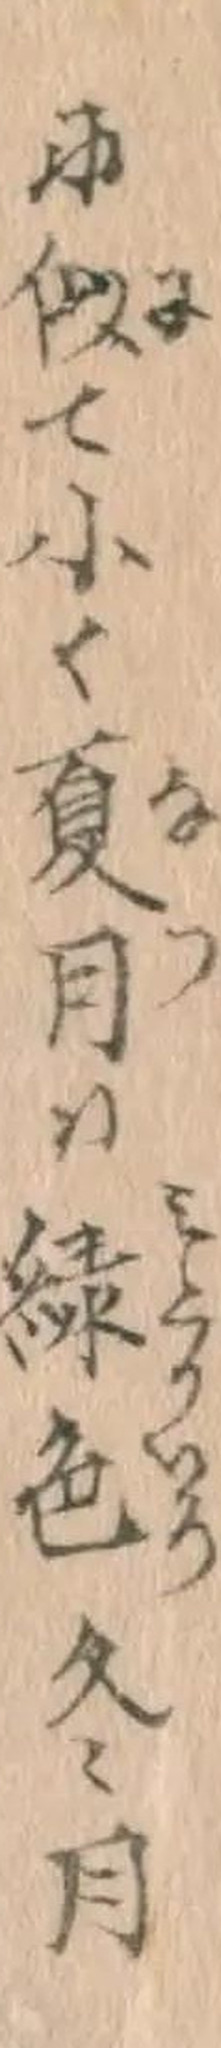に似て小く夏月は緑色冬月
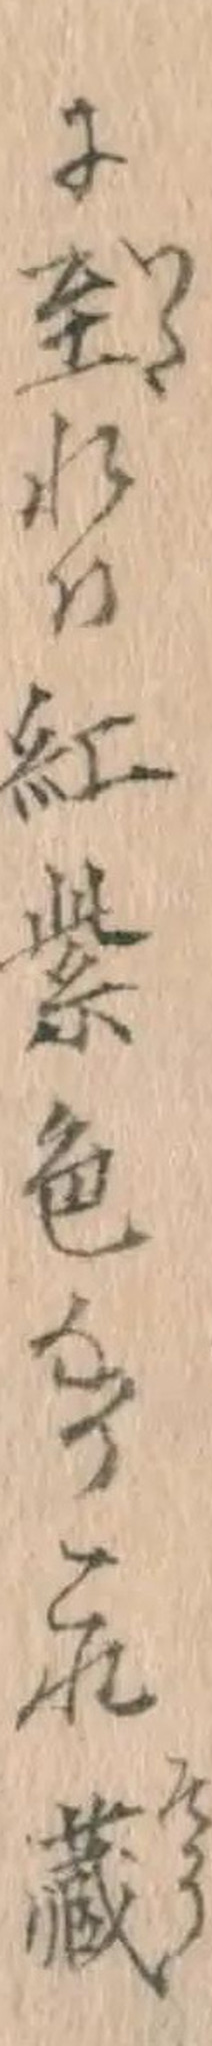に至れは紅紫色なりこれ蔵
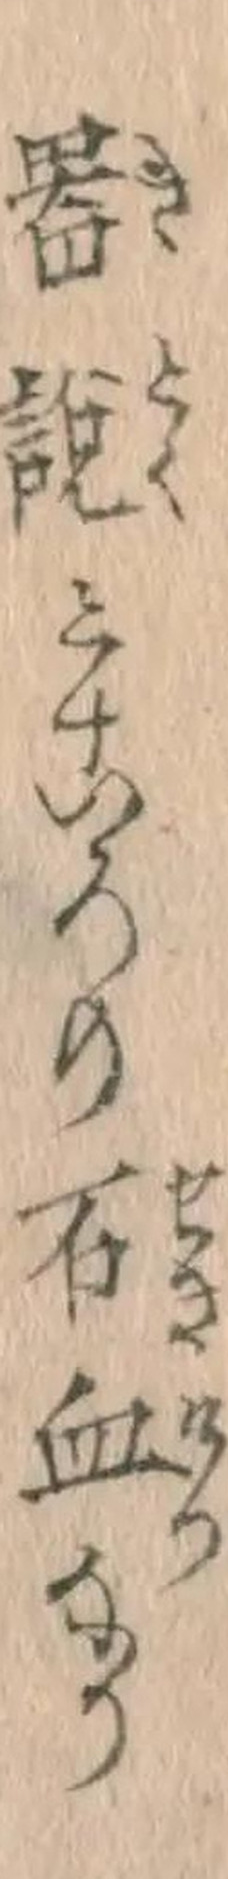器説ところの石血なり

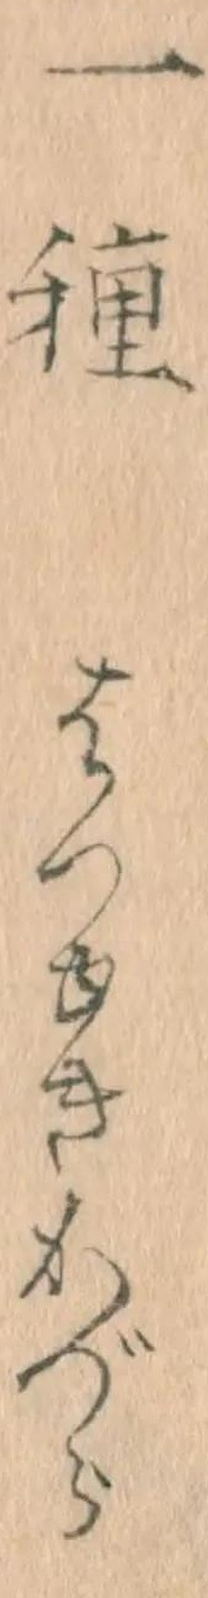一種はつゆきかづら
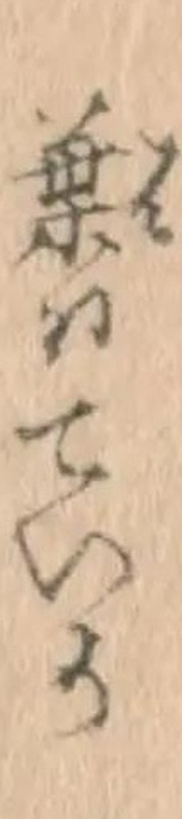葉はていか
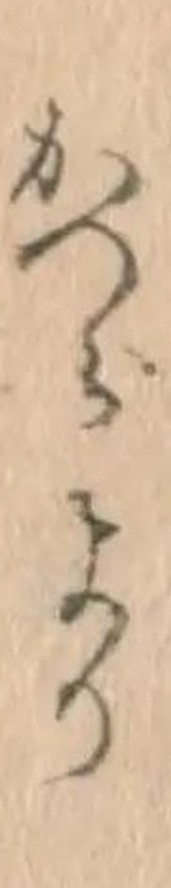かつらより
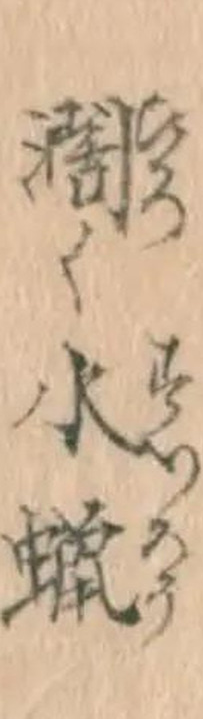闊く水蝋
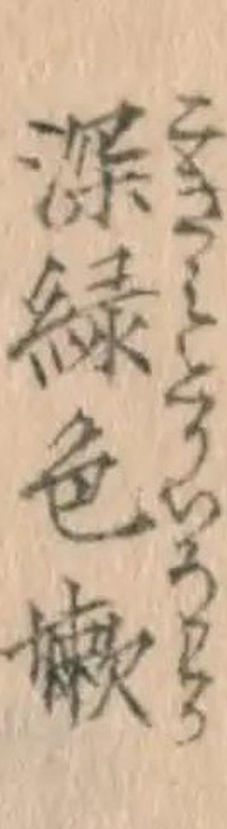深緑色嫩
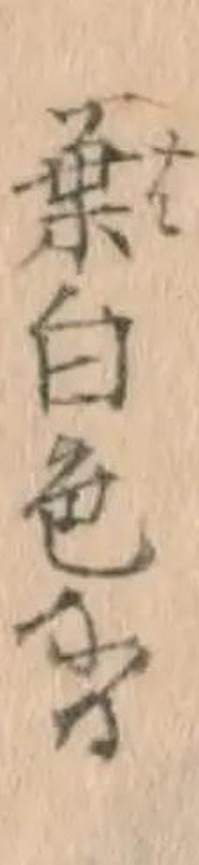葉白色なる
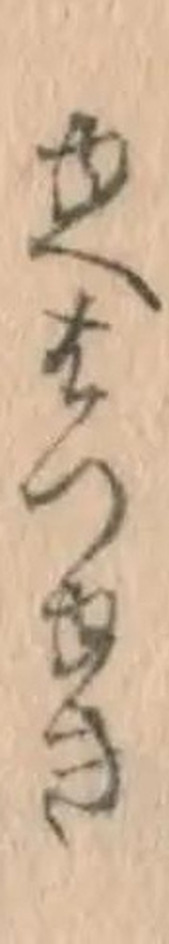ゆへはつゆき
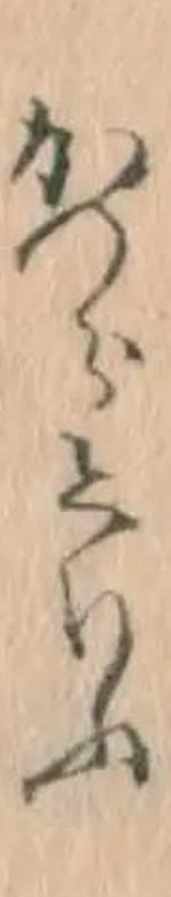かつらといふ
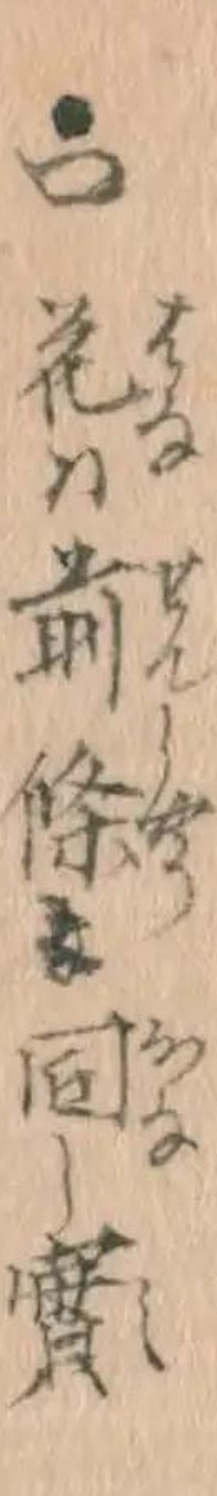●花は前条と同し実
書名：本草図譜. 巻31-33
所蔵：国立国会図書館 National Diet Library, JAPAN
